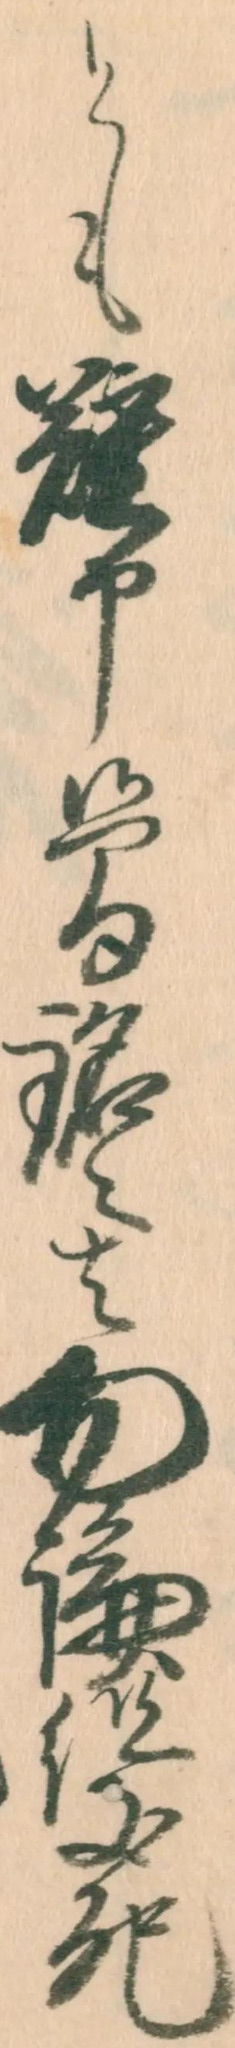とも難申候間銘〻は勿論組支配
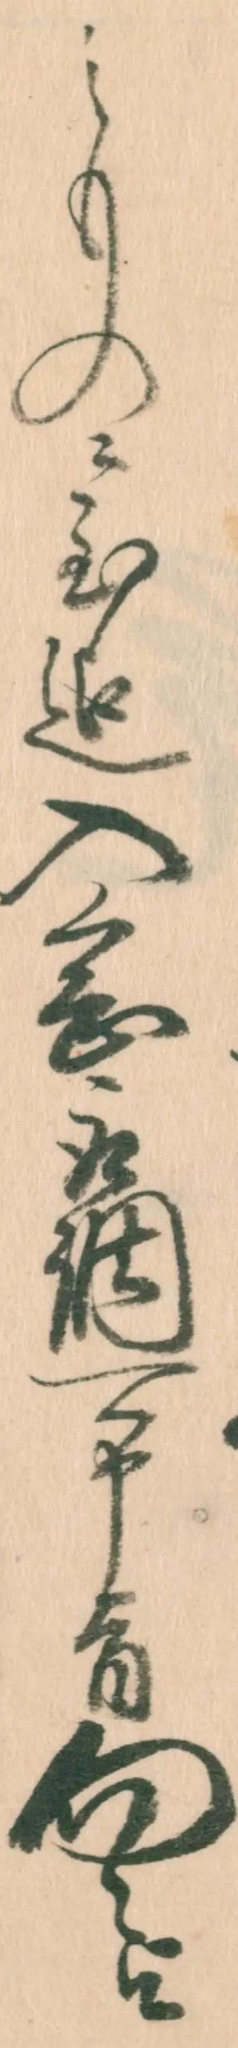之ものニ至迄入念取調可申旨向〻え
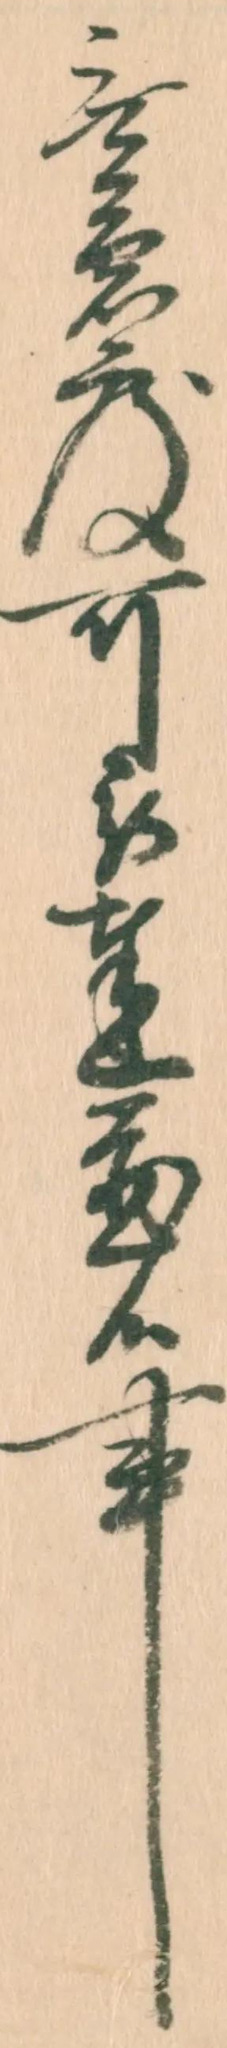無急度可被達置候事
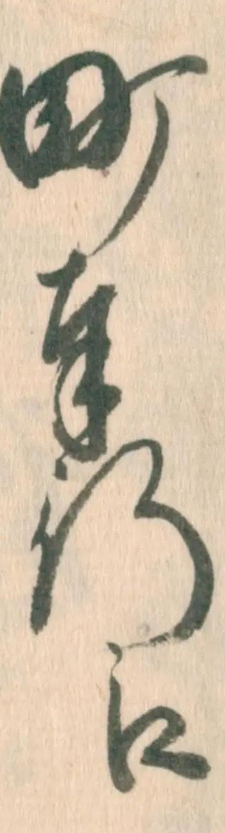│町奉行え
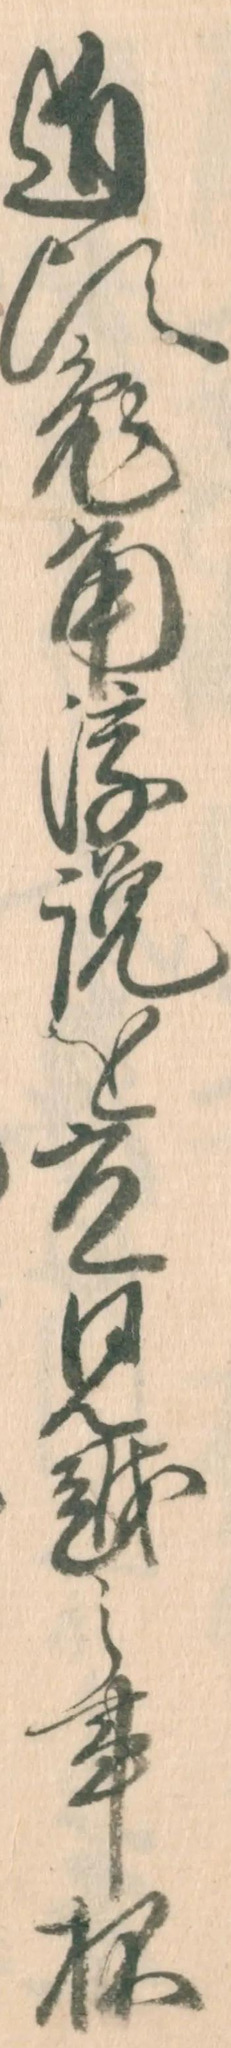近頃兎角浮説を先見越之事抔
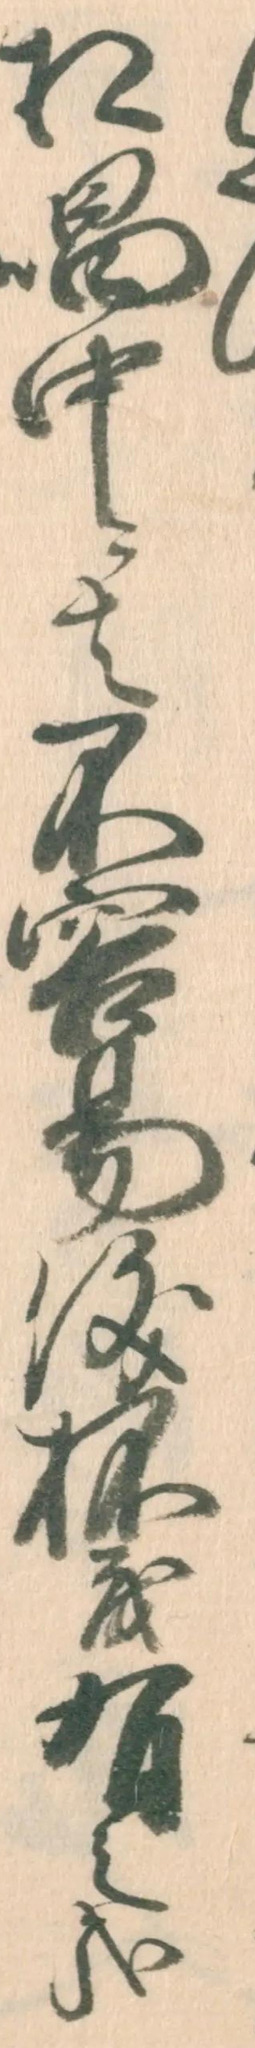相唱中ニは不容易儀抔も有之哉
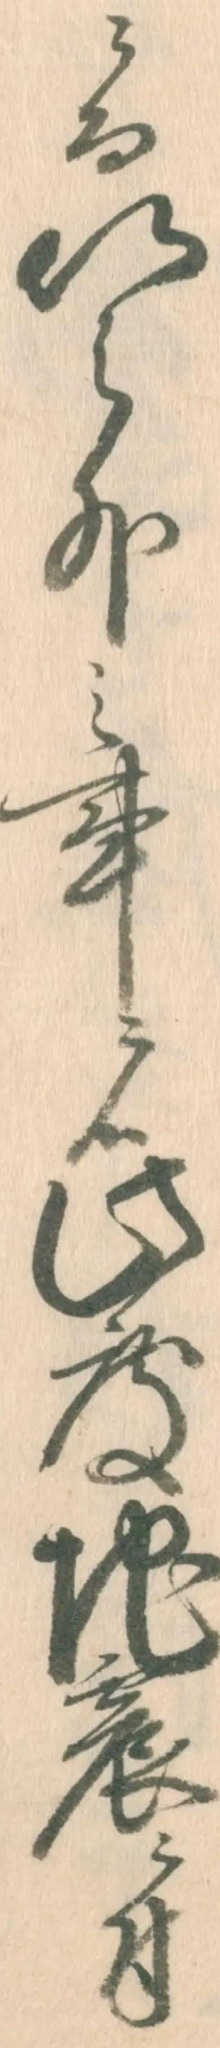ニて以之外之事ニ候此度地震ニ付

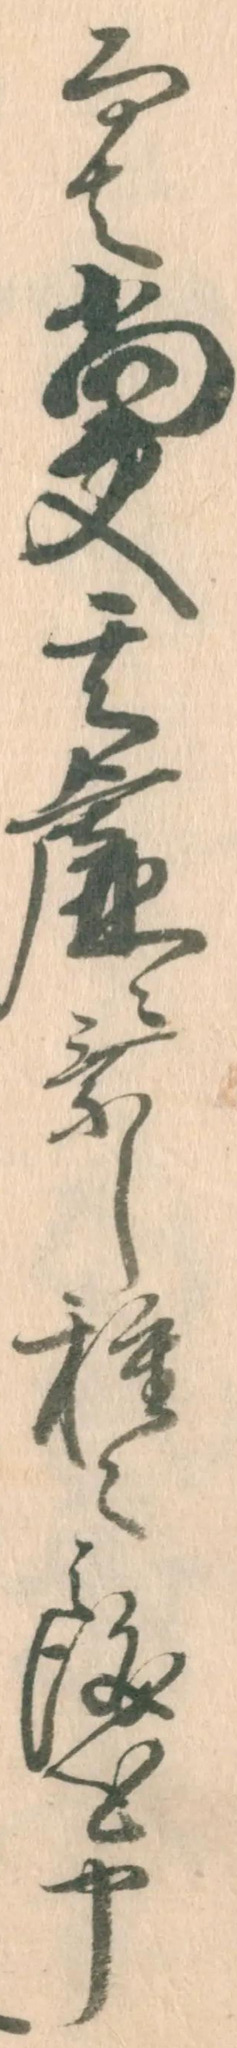ては尚又其虚ニ乗し種〻之儀を申
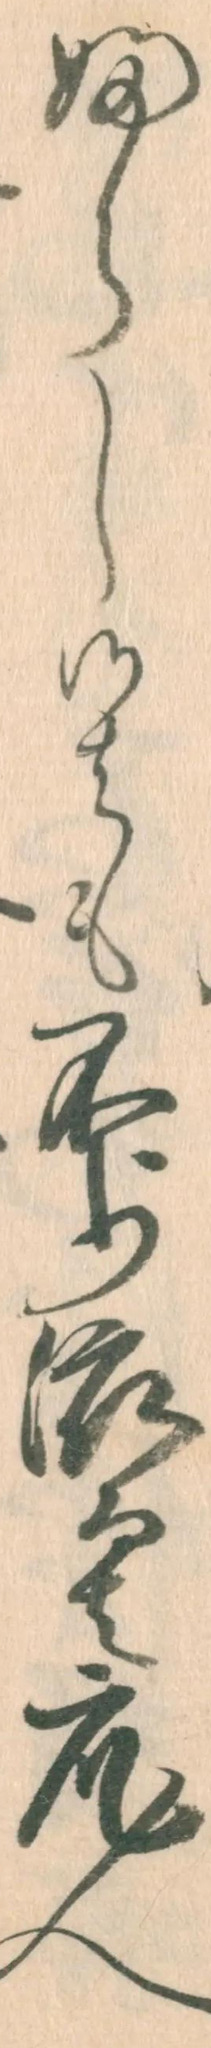ふらし候者も不少依ては衆人
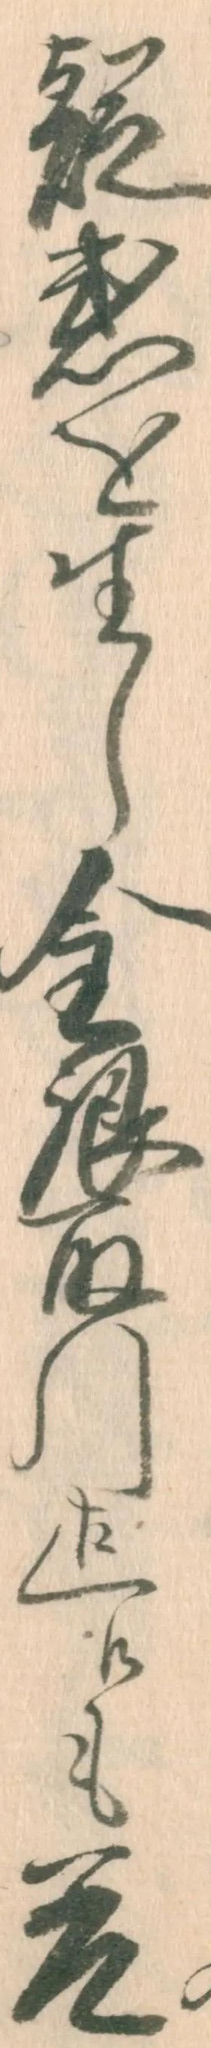疑惑を生し金銀取引迄えも差
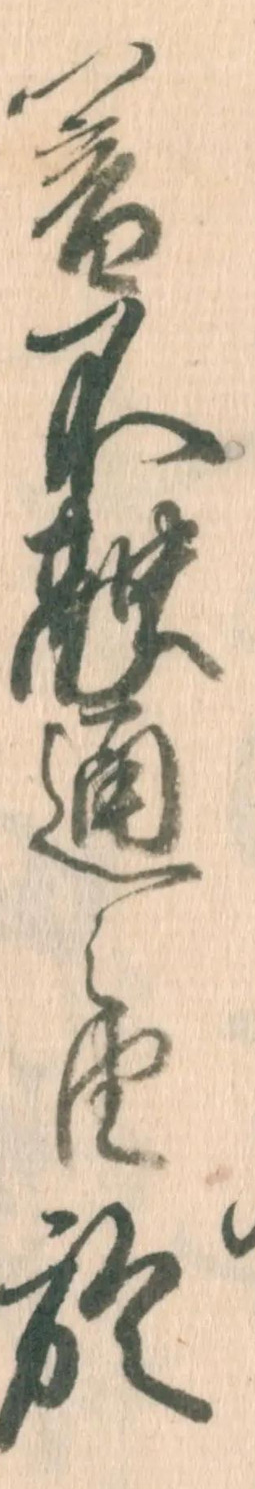響不融通之由於
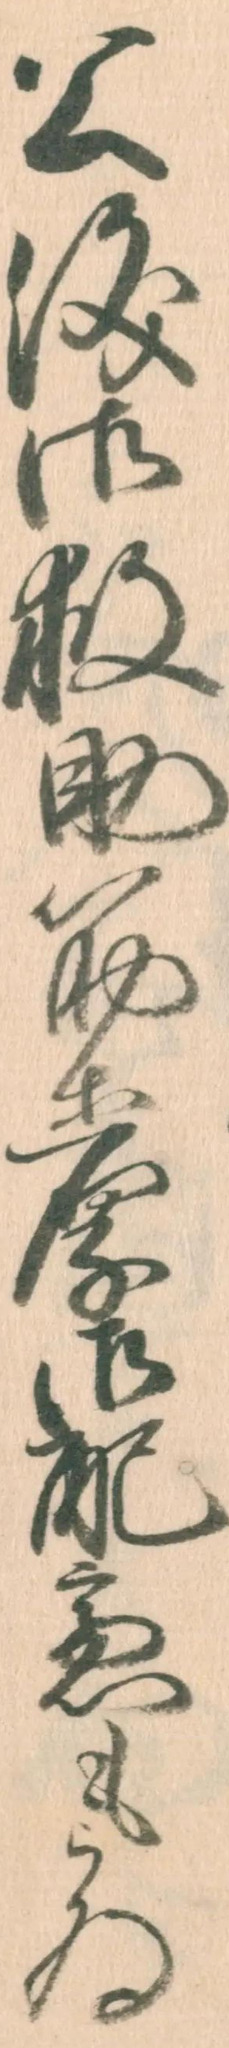公儀御救助筋等厚御配慮も為
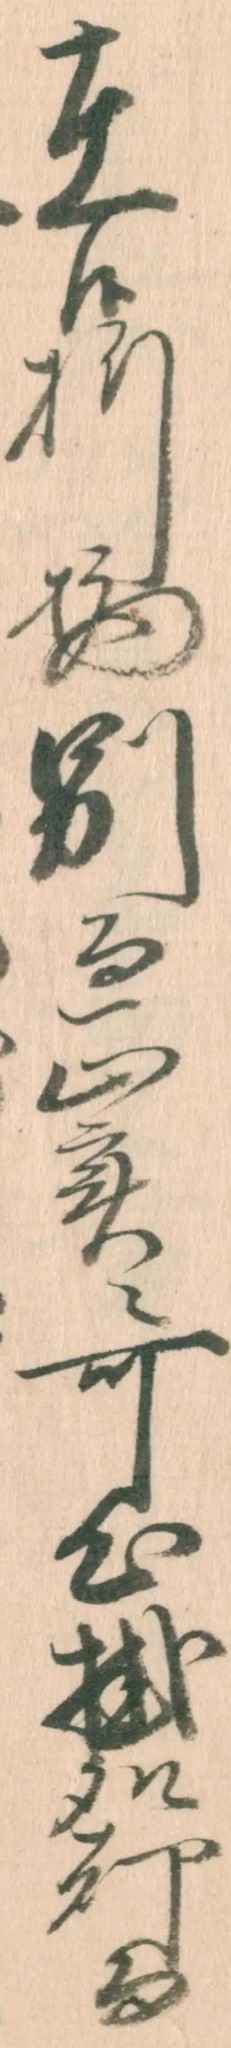在候折柄別て正実ニ可心掛処却て
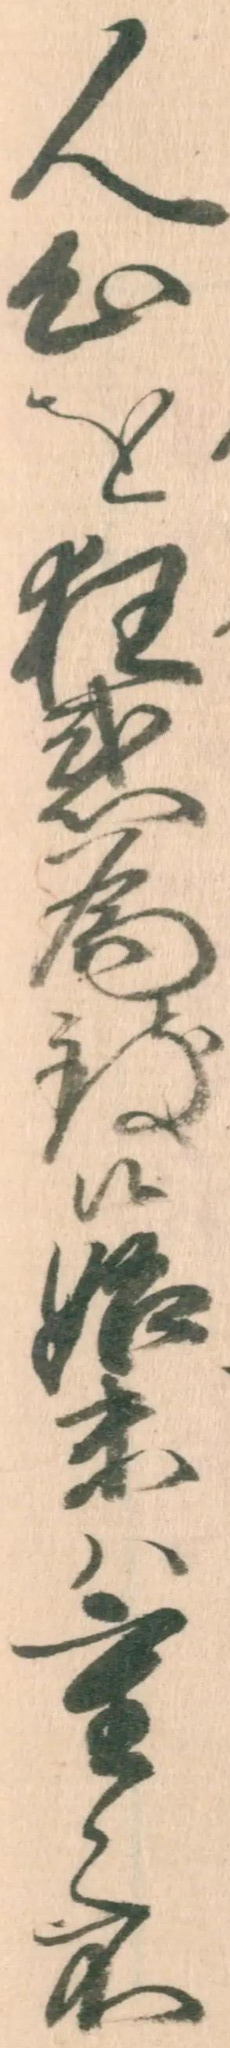人心を狂惑為致候始末ハ重〻不
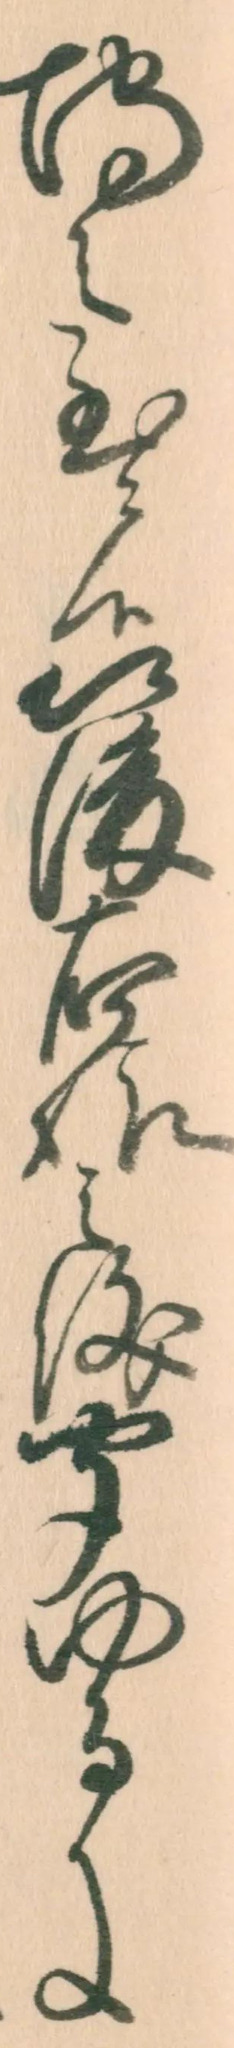埒之至ニ候以後右様之儀聞ゆるに
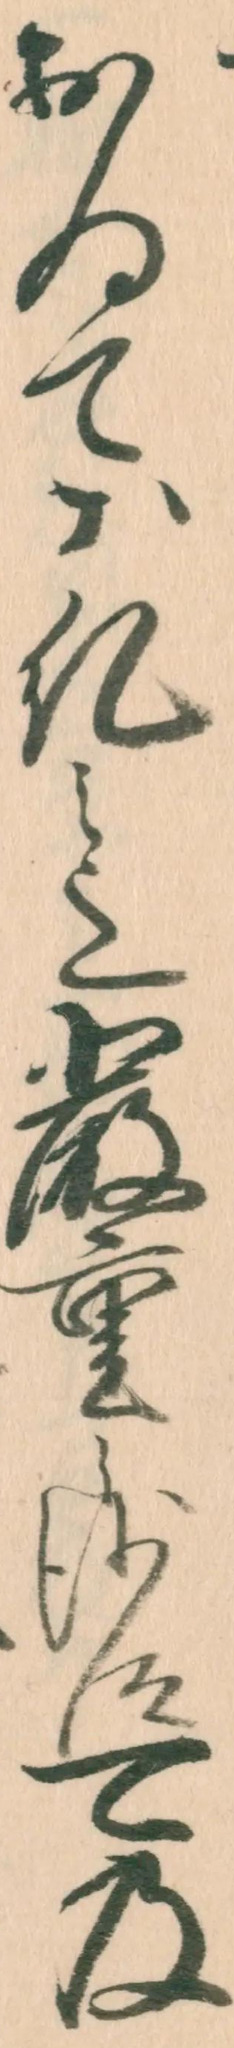おゐてハ糺之上厳重之沙汰可及
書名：地震災書留 2巻. [2] 内表紙に「地震一件　安政二卯年十月」とあり
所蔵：国立国会図書館 National Diet Library, JAPAN
